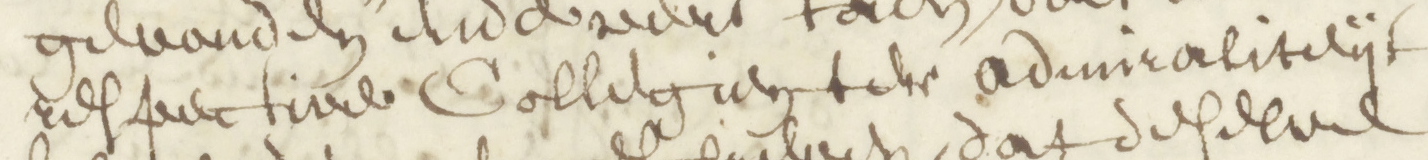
respective Collegien ter Admiraliteijt
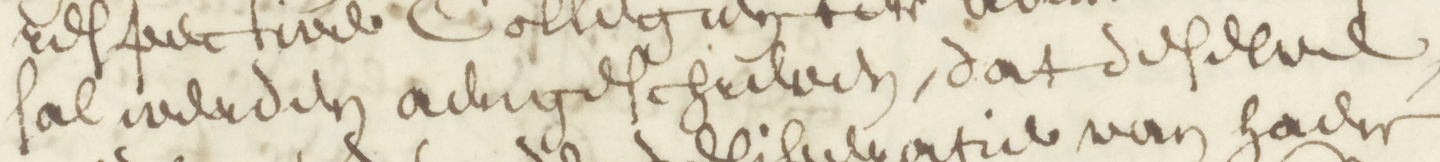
sal werden aengeschreven, dat deselve
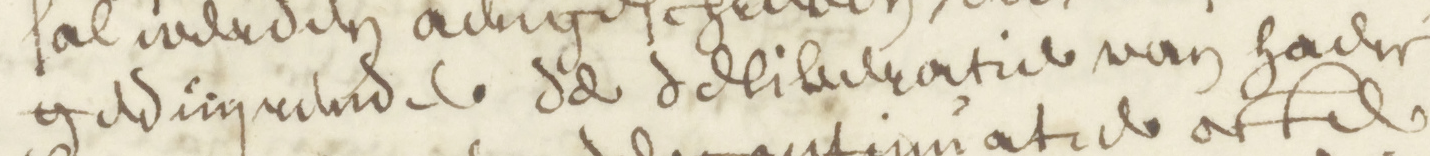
geduijrende de deliberatie van haer
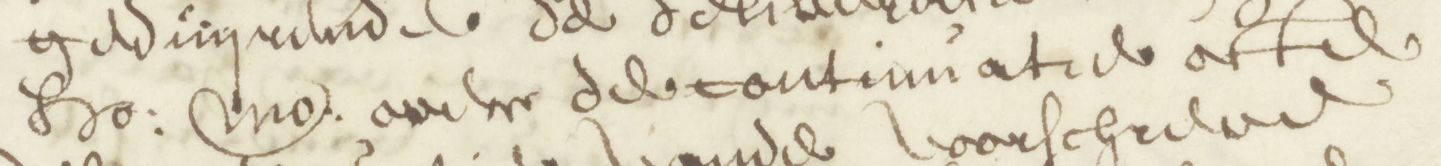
Ho:Mo: over de continuatie ofte
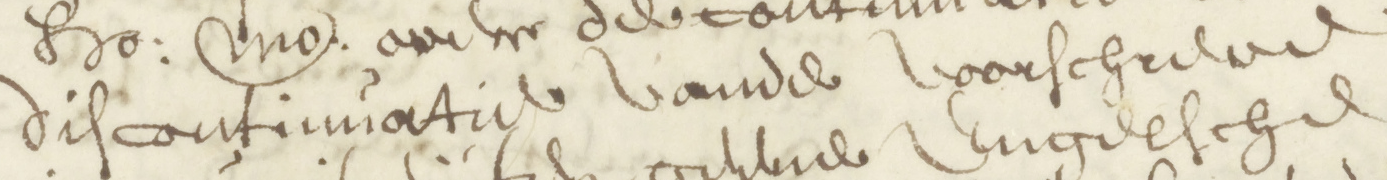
discontinuatie vande voorschreve
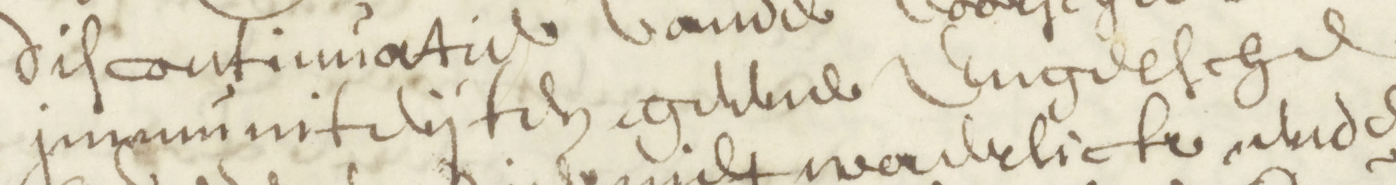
immuniteijten geene Engelsche
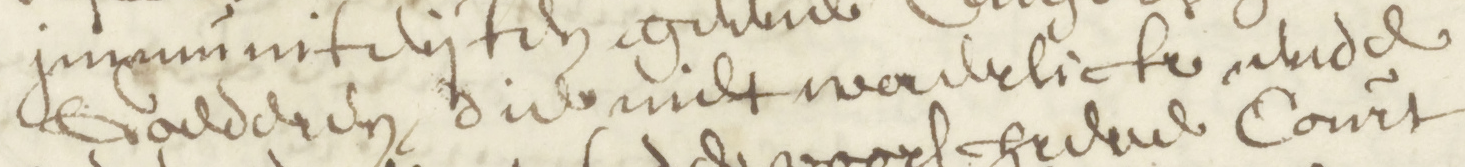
Goederen, die niet waerlick ende
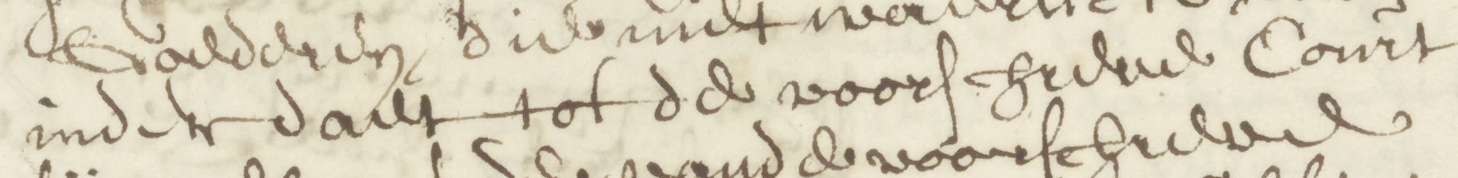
inderdaet tot de voorschreve Court
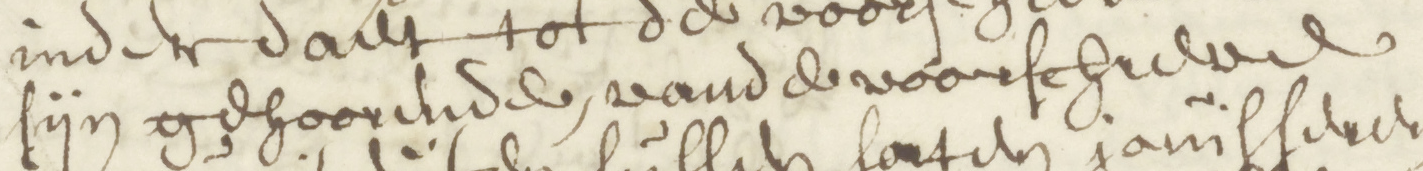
sijn gehoorende, vande voorschreve
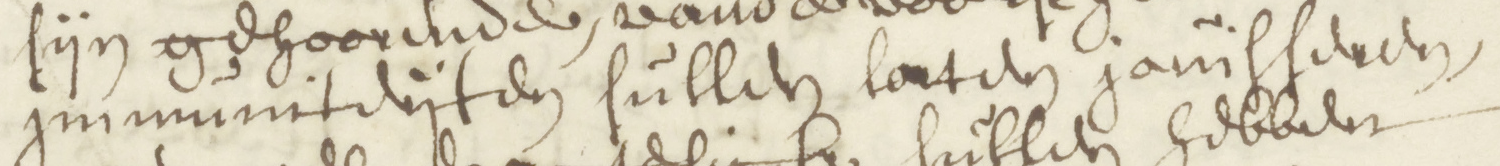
Immuniteijten sullen laten jouisseren,
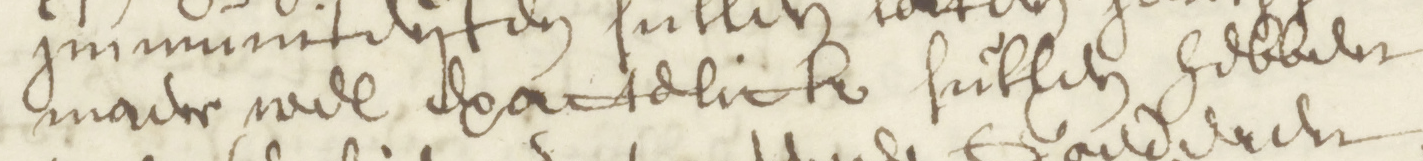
maer wel exactelick sullen hebben
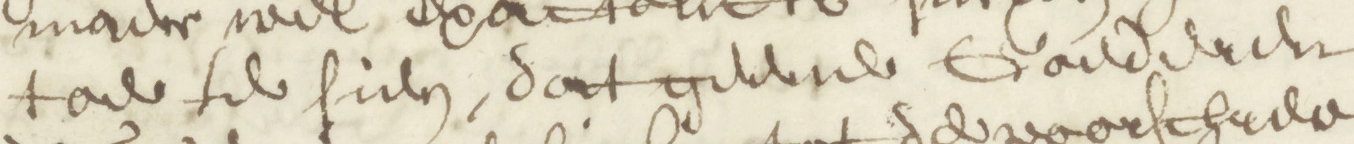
toe te sien, dat geene Goederen
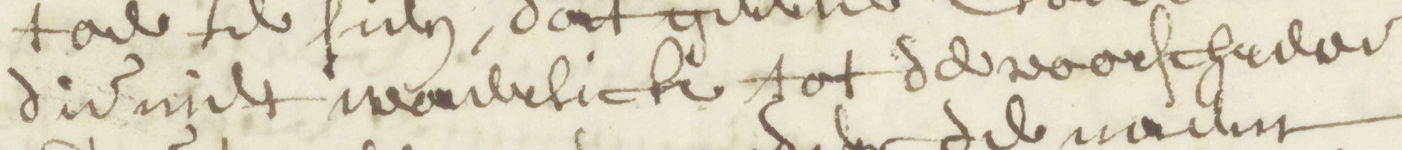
die niet waerlick tot de voorschreve
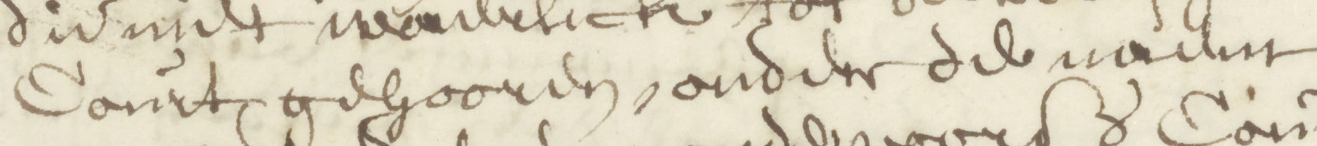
Court gehooren, onder de naem
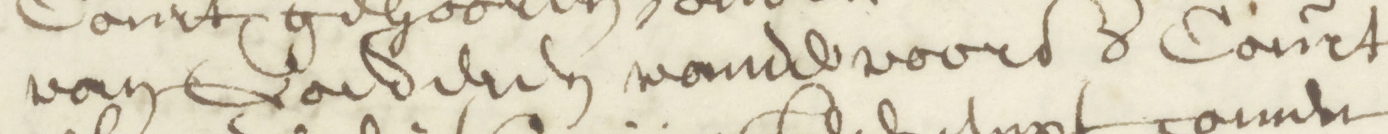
van Goederen vande voors Court
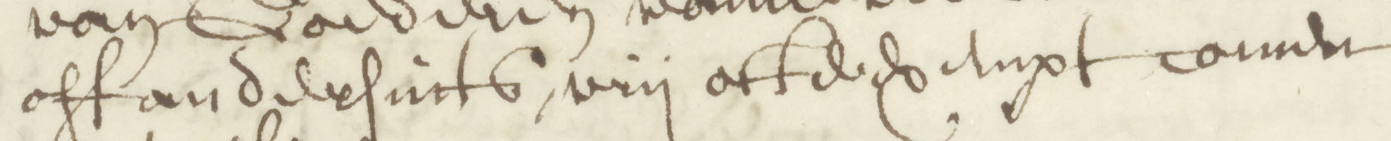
oft andersints, vrij ofte exempt comen
